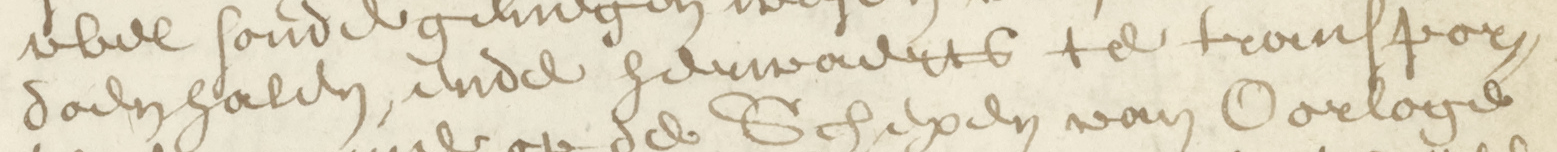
doen halen, ende herwaerts te transpor,,
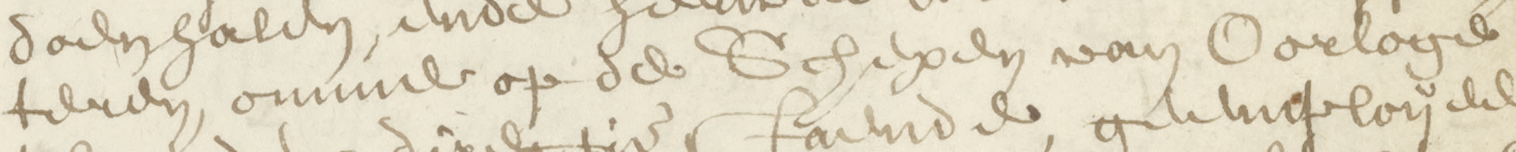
teren, omme op de Schepen van Oorloge
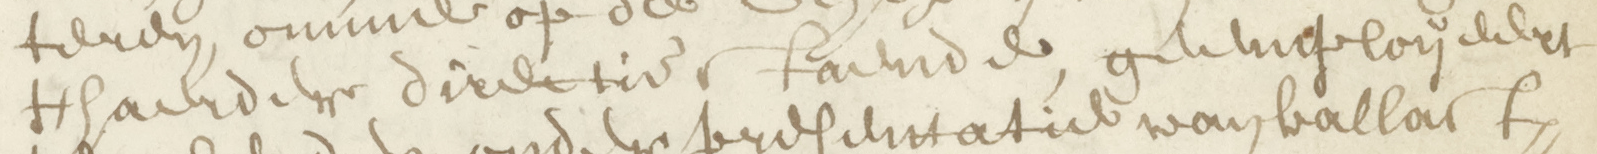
t‛haerder directie staende, geemploijeert
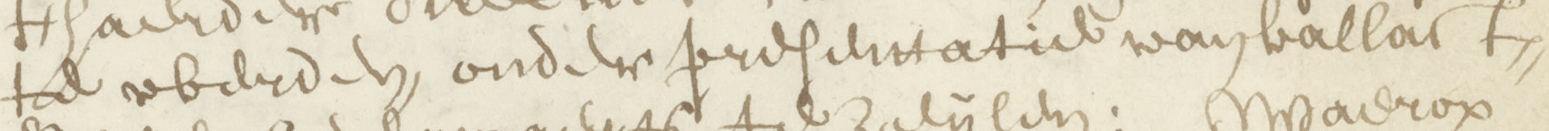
te werden, onder presentatie van ballast,,
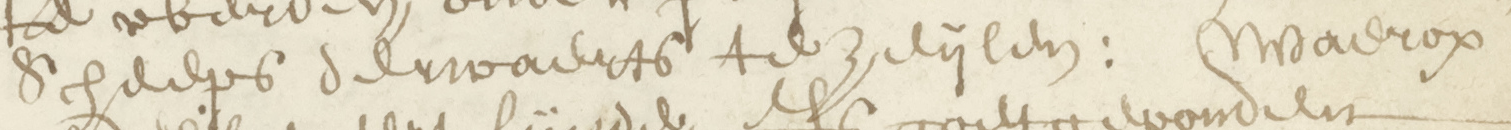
Scheeps derwaerts te zeijlen: Waerop
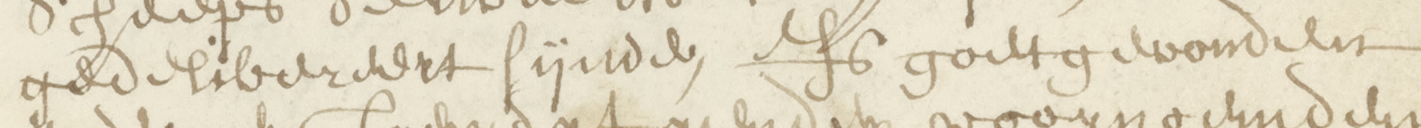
gedelibereert sijnde, Is goetgevonden
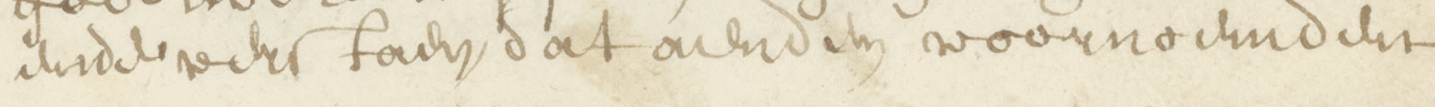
ende verstaen, dat aenden voornoemden
